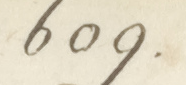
609.
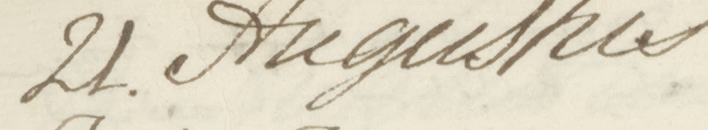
21. Augustus.
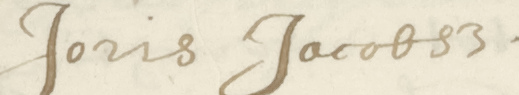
Joris Jacobsz.
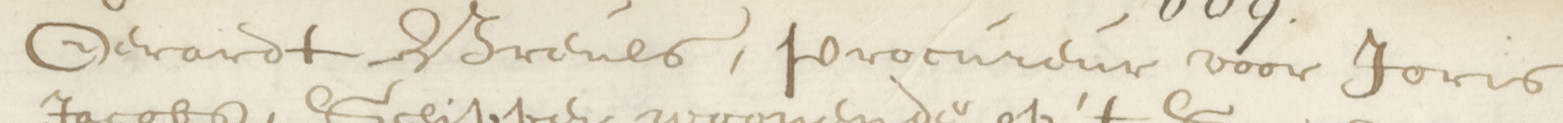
Gerardt Breuls, Procureur voor Joris
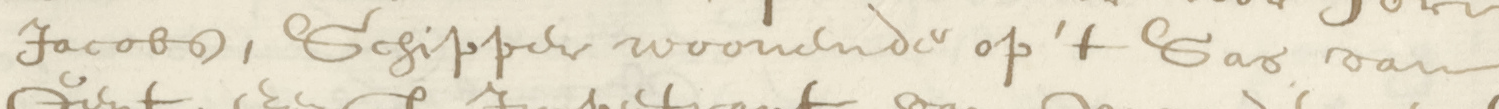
Jacobs, Schipper woonende op't Sas van
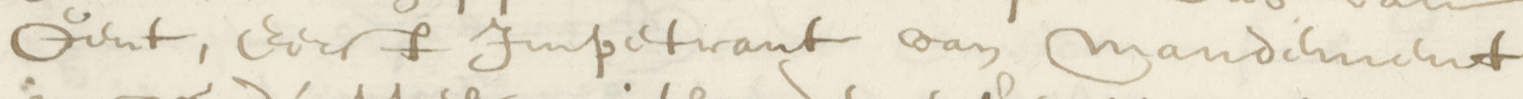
Gent, Eerst Impetrant van Mandement
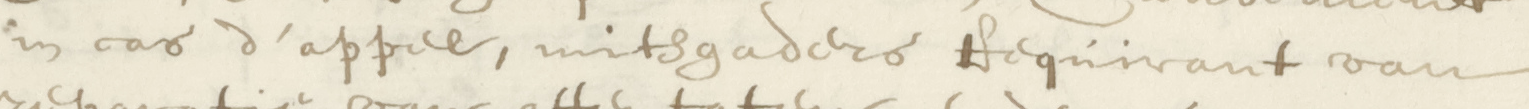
in cas d'appel, mitsgaders Requirant van
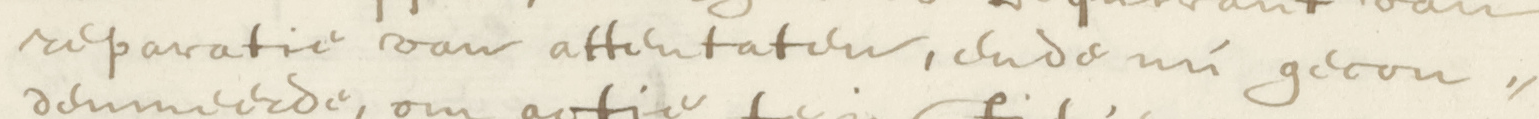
reparatie van attentaten, ende nu gecon„
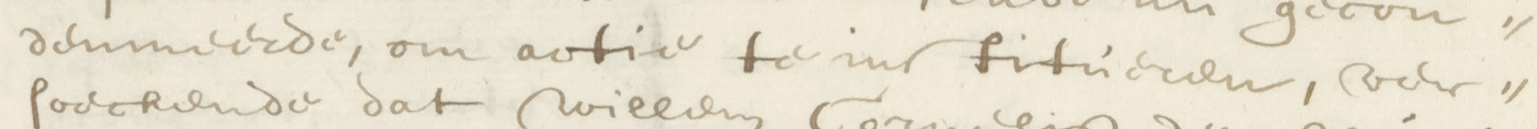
demneerde, om actie te institueren, ver„
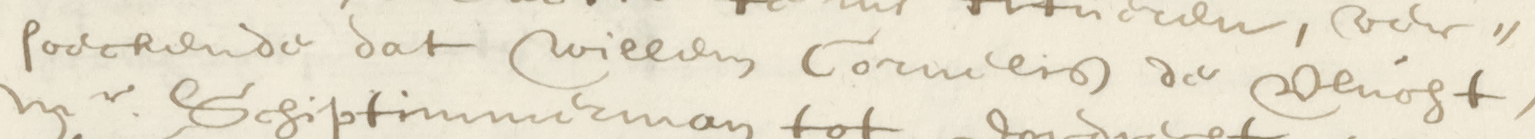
soeckende dat Willem Cornelis de Vlucht,
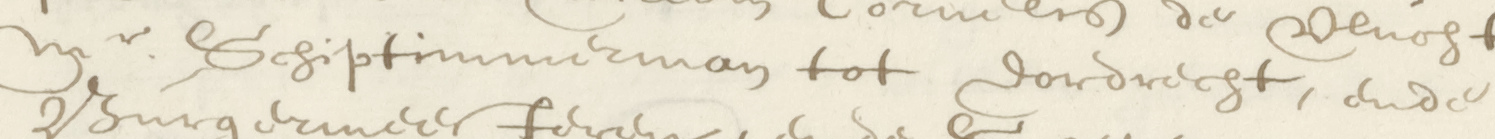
Mr. Schiptimmerman tot Dordrecht, ende
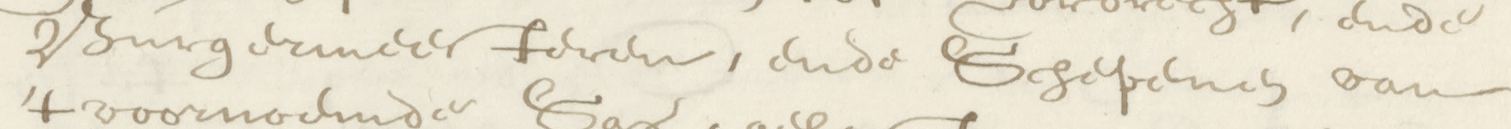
Burgermeesteren, ende Schepenen van
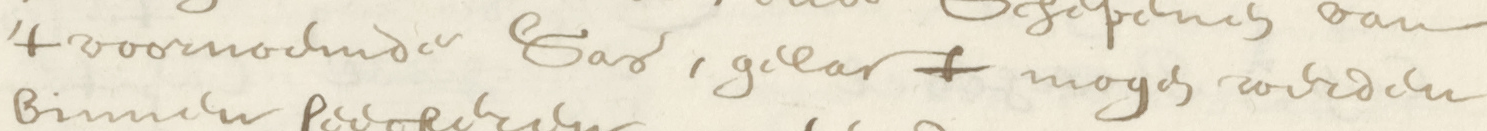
‛t voornoemde Sas, gelast mogen werden,
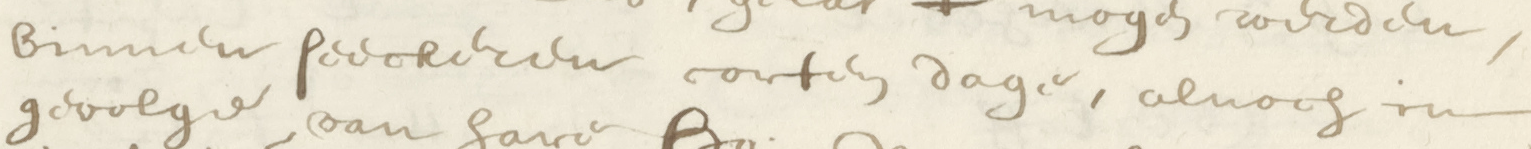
binnen seeckeren corten dage, alnoch in
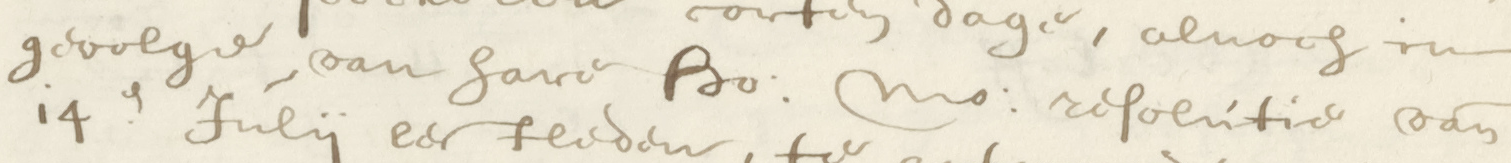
gevolge van hare Ho:Mo: resolutie van
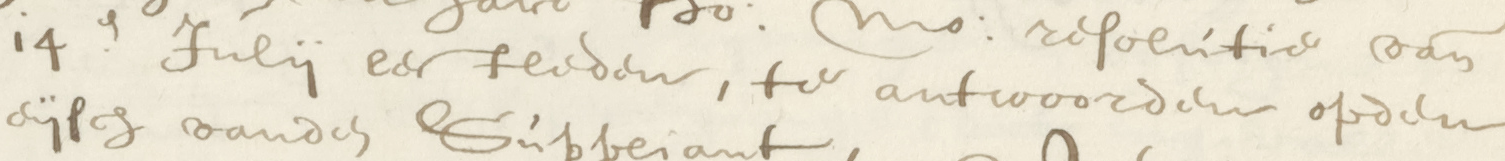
14e. Julij lestleden, te antwoorden opden
